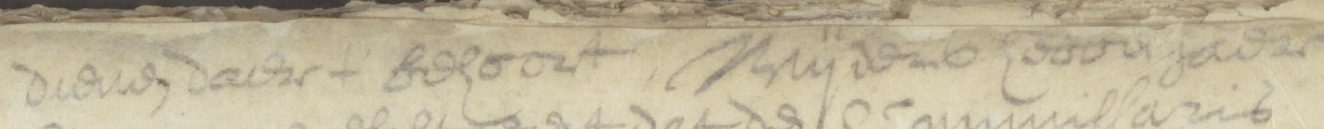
dienen daar t'behoort. Wijders hebben haer
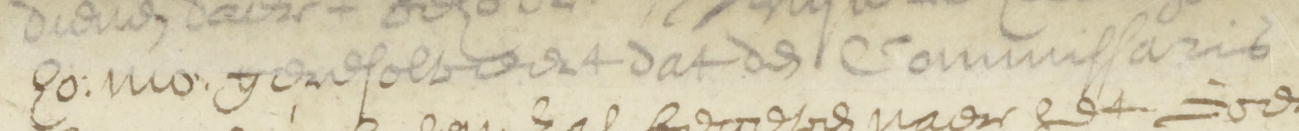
ho: mo: geresolveert dat den Commissaris
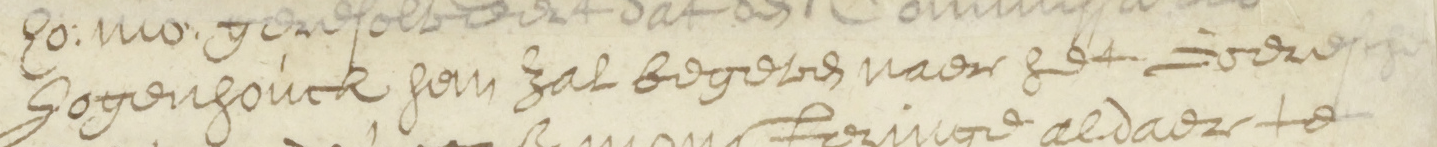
Hogenhouck hem zal begeven naer het Goeresche
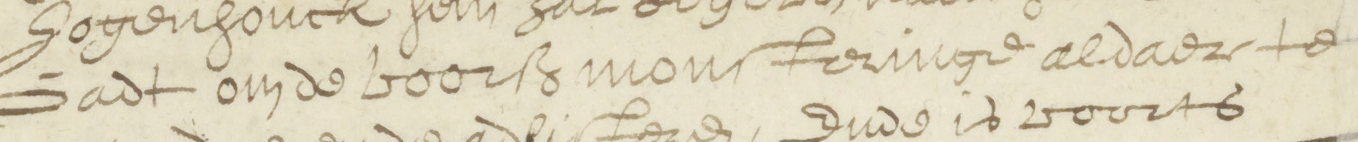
Gadt om de voorsz monsteringe aldaer te
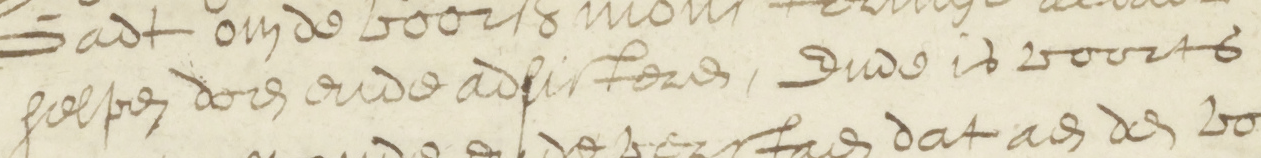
helpen doen ende adsisteren. Ende is voorts
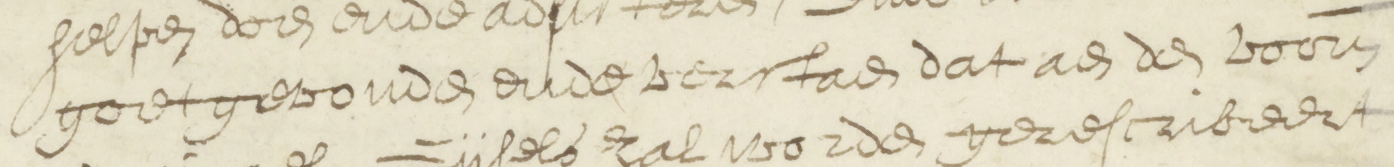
goetgevonden ende verstaen dat aen den voorn
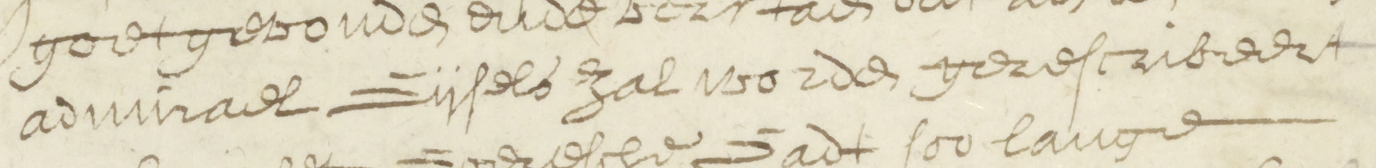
admirael Gijsels zal worden gerescribeert
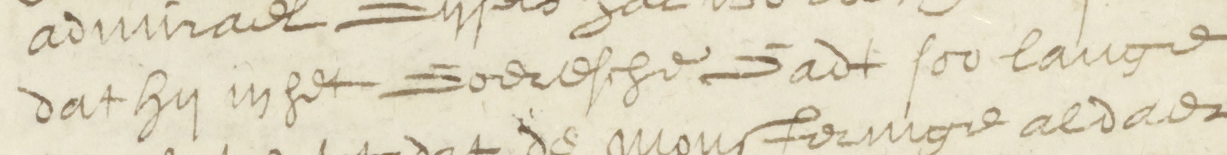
dat hij in het Goeresche Gadt soo lange
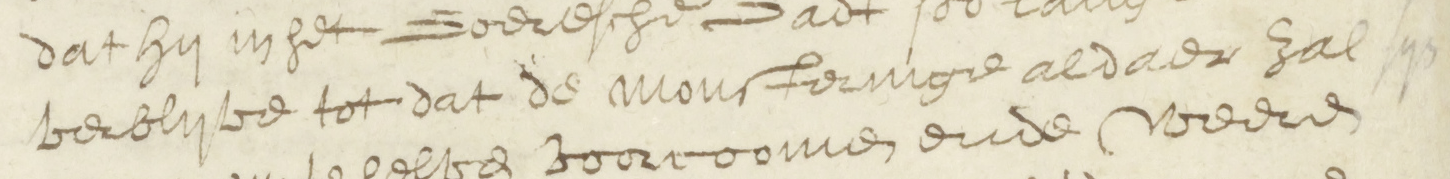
verblijve tot dat de monsteringe aldaer zal sijn
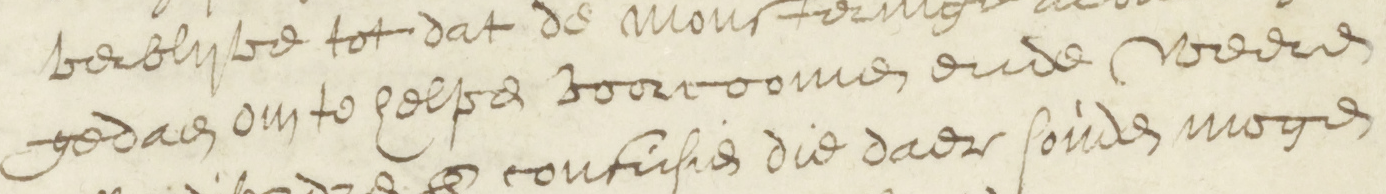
gedaen om te helpen voorcoomen ende weeren
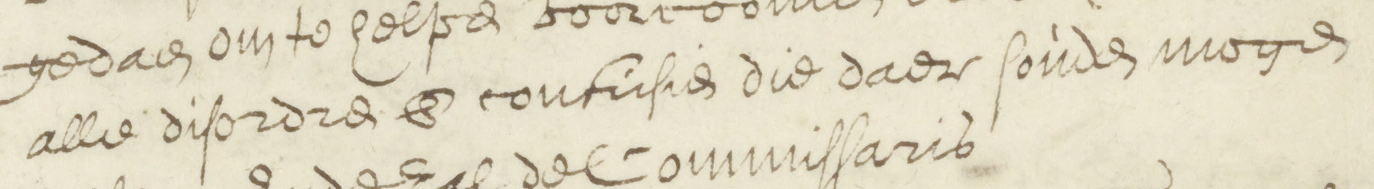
alle disordren & confusien die daer souden mogen
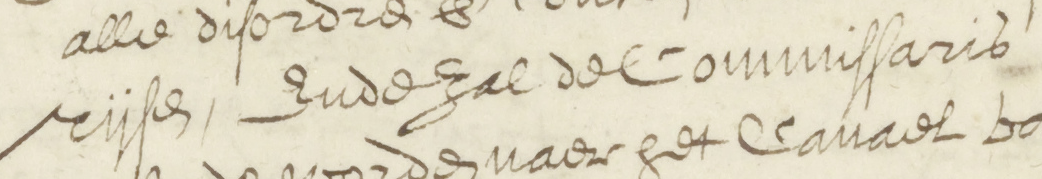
rijsen. Ende zal de commissaris
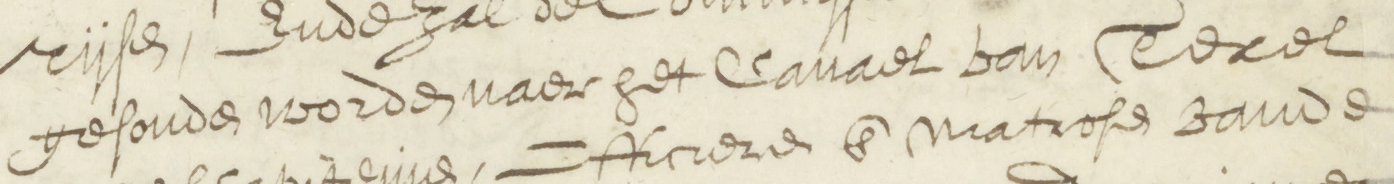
gesonden worden naer het Canael van Texel
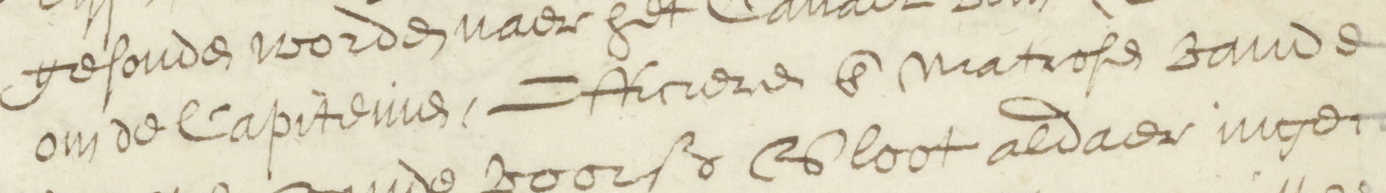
om de Capiteinen, Officieren & matrosen vande
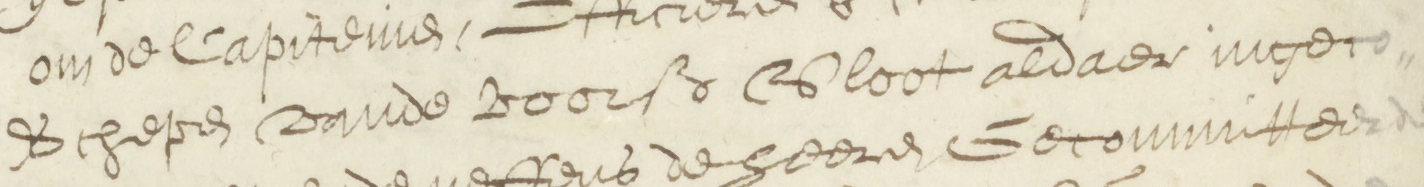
Schepen vande voorsz Vloot aldaer ingeco„
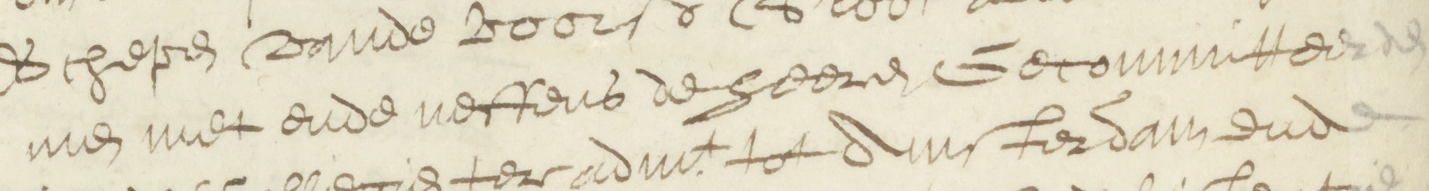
men met ende neffens de heeren Gecommitteerden
